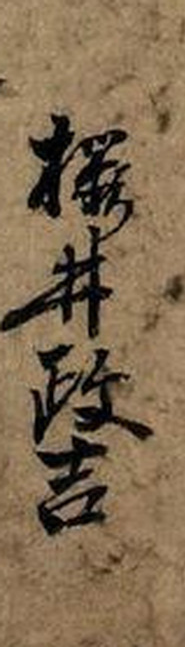桜井政吉
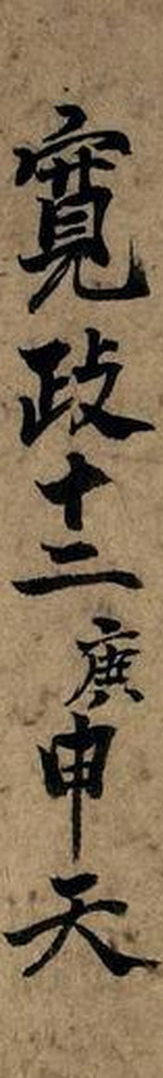寛政十二庚申天
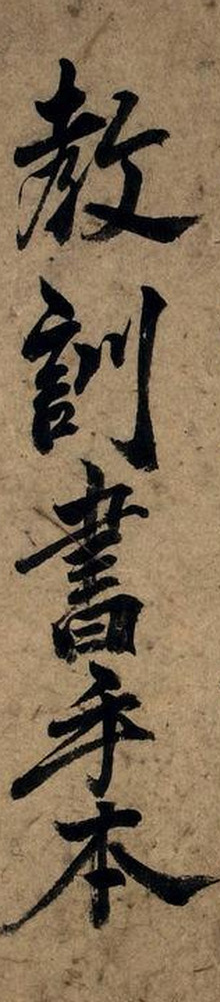教訓書手本
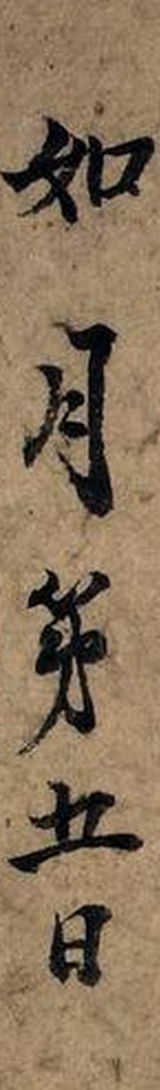如月第五日

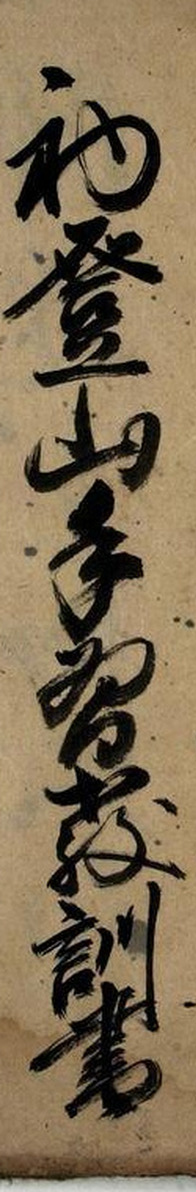初登山手習教訓書

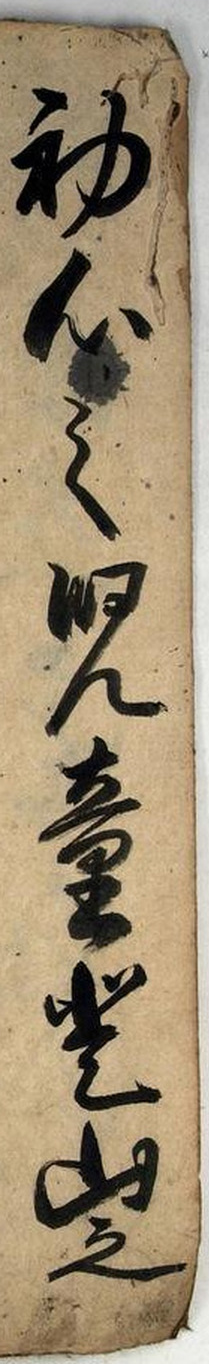初心之児童登山之
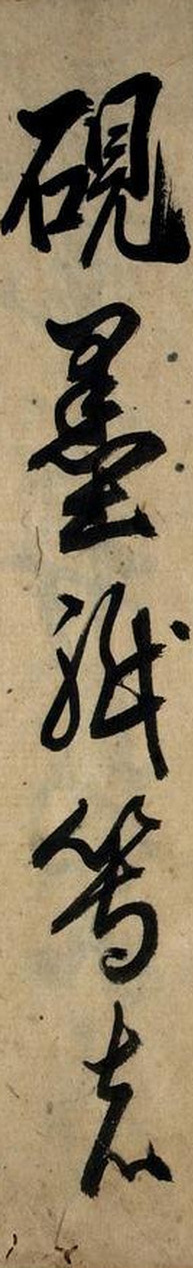硯墨紙等は

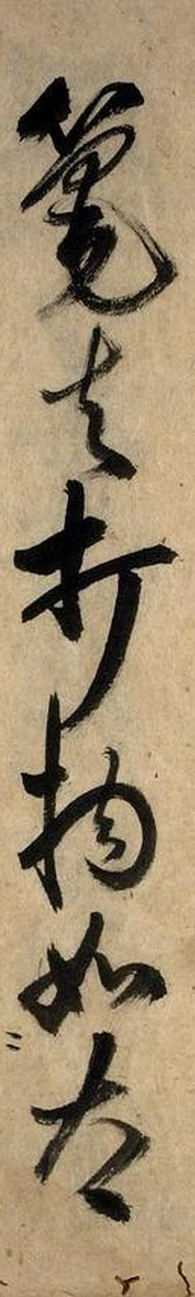筆は打物如太
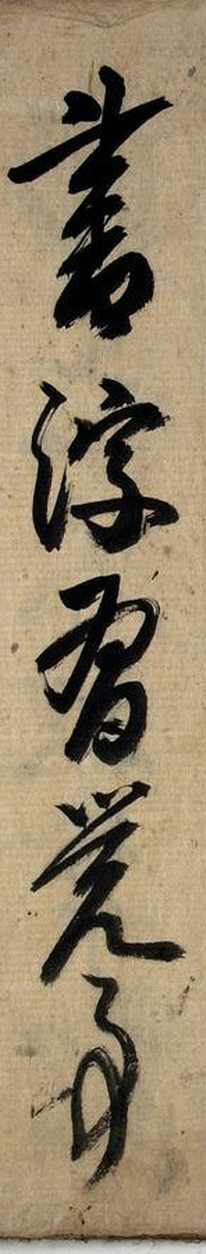書浮習覚事

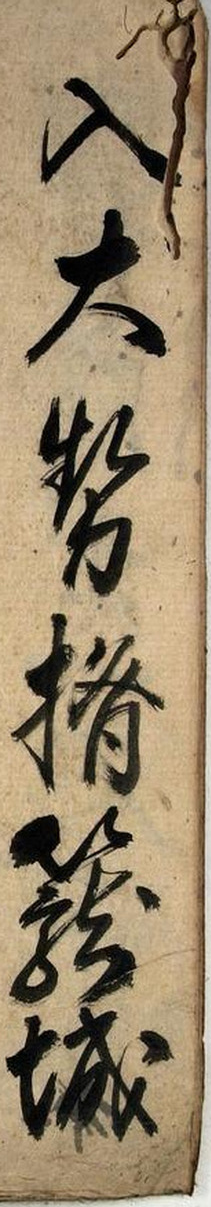入大勢楯籠城
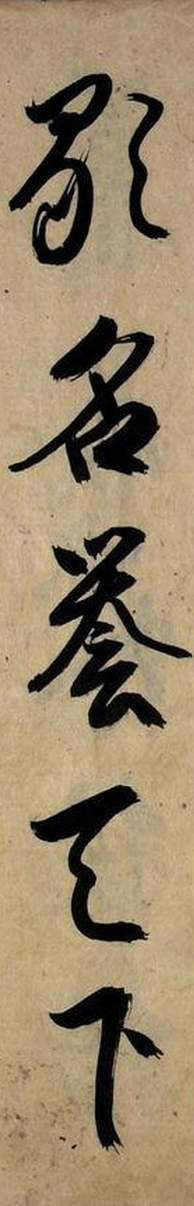顕名誉天下
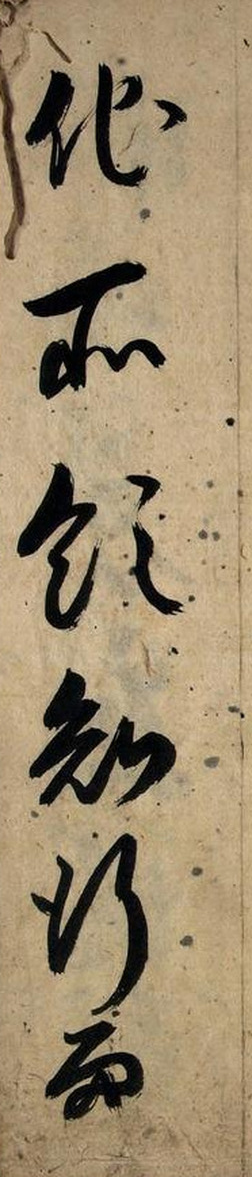他所領知行而

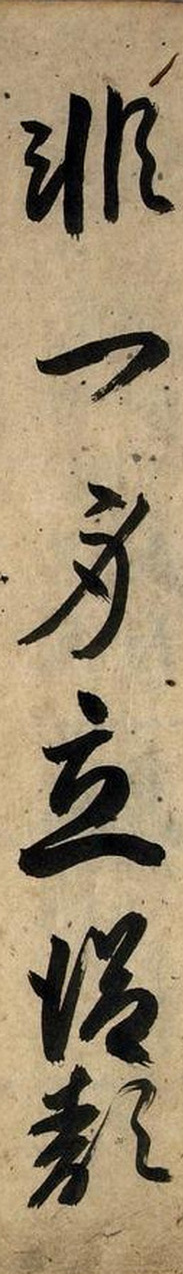非一身立従類
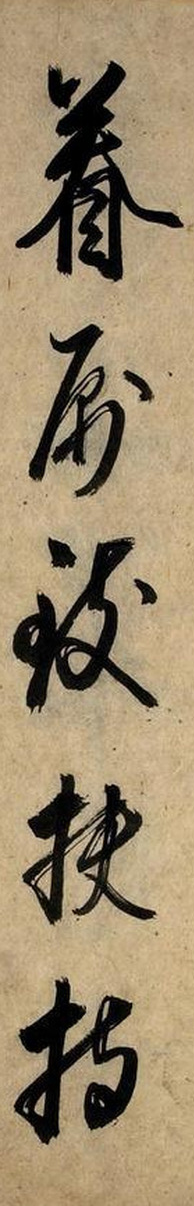眷属致扶持
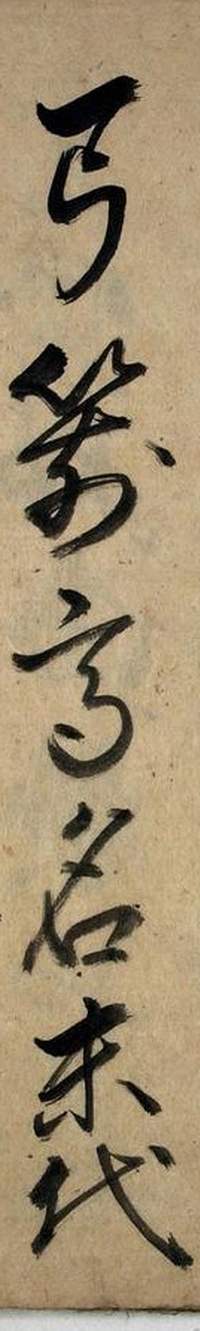弓箭高名末代
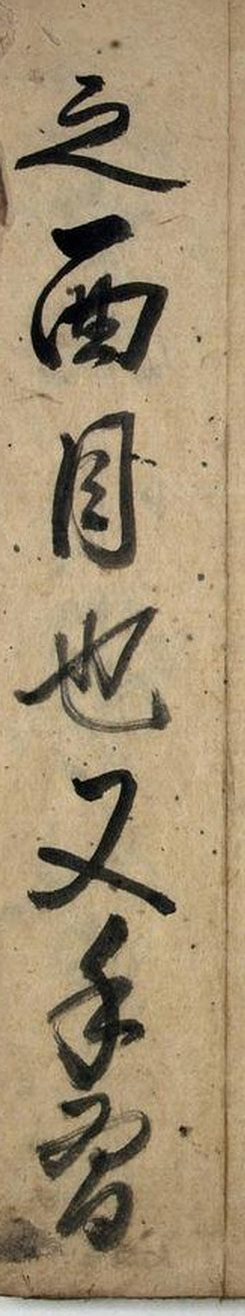之面目也又手習
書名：教訓書手本（手習、初登山山手習教訓書）
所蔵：福井県文書館 Fukui Prefectural Archives
